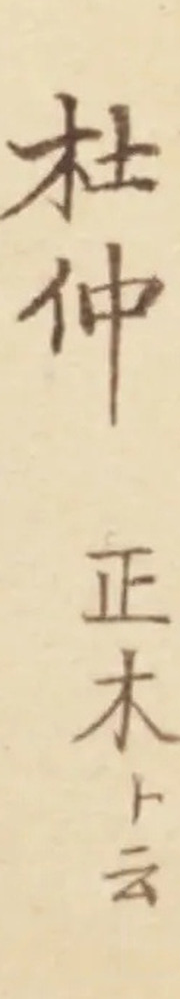杜仲正木と云
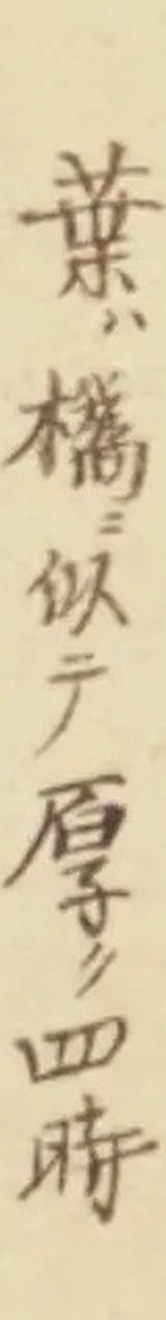葉は橘に似て厚く四時籬
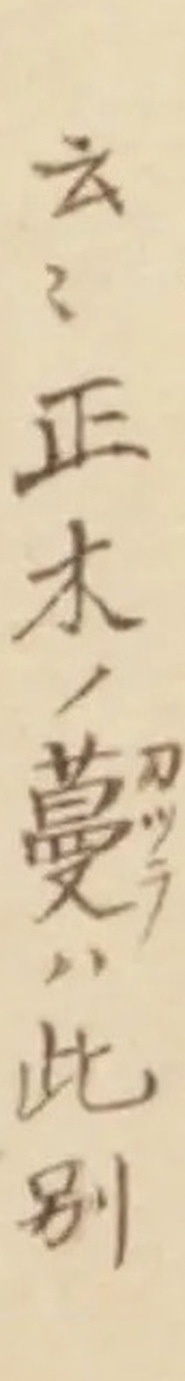云々正木の蔓は此別
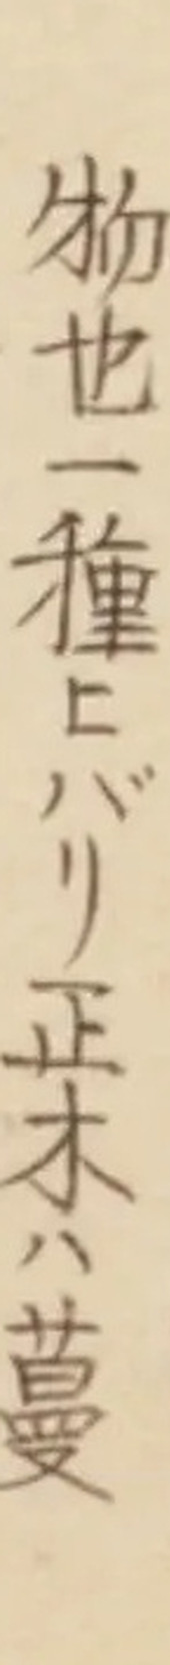物也一種ひばり正木は蔓
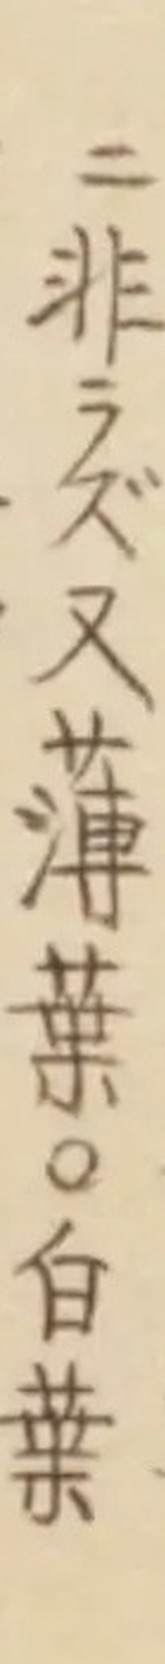に非らず又薄葉〇白葉
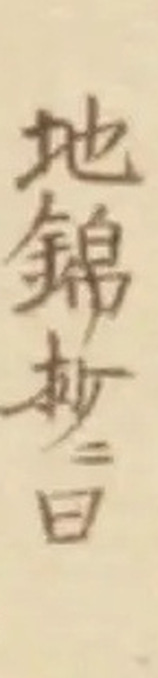地錦抄に曰
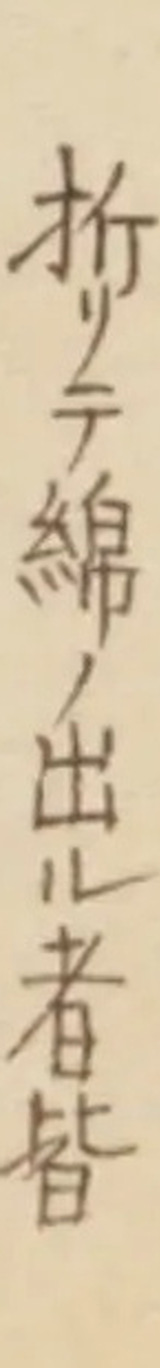折りて綿の出る者皆
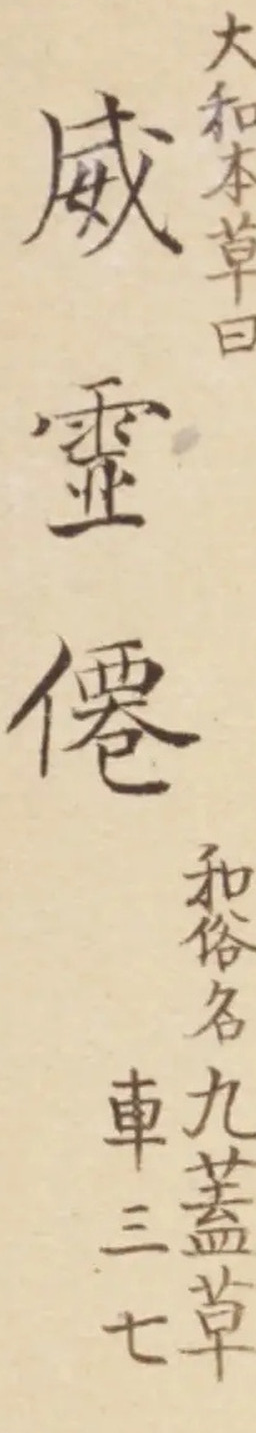威霊遷車三七
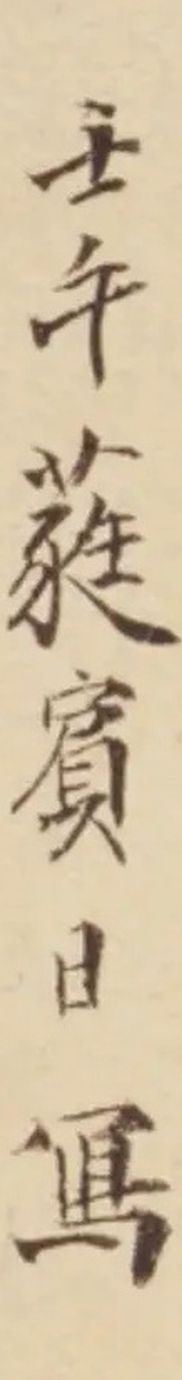壬午蕤賓日寫
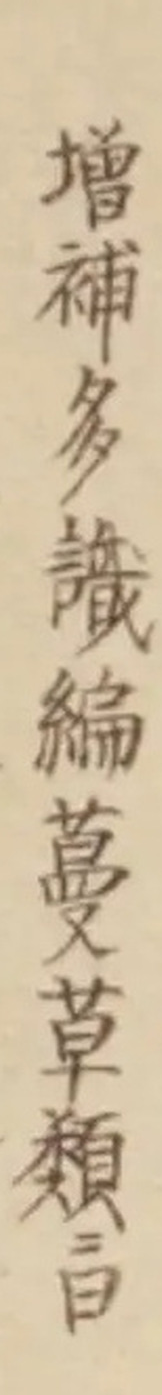増補多識編蔓草類に曰

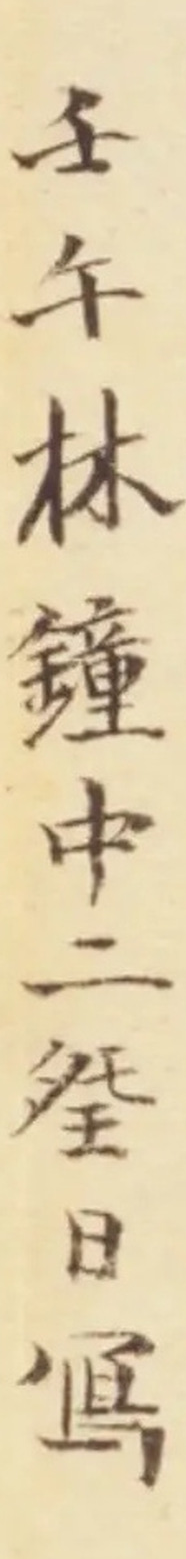壬午林鐘中二望日寫

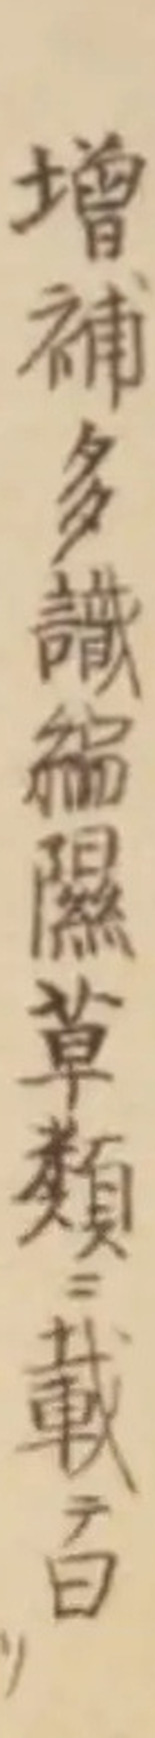増補多識編隰草類に載て曰
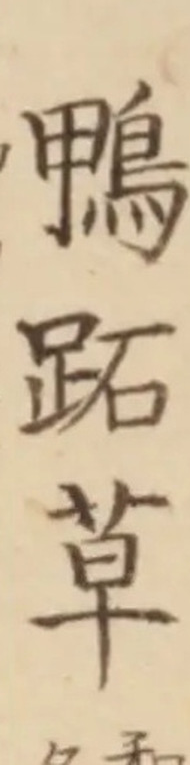鴨頭草
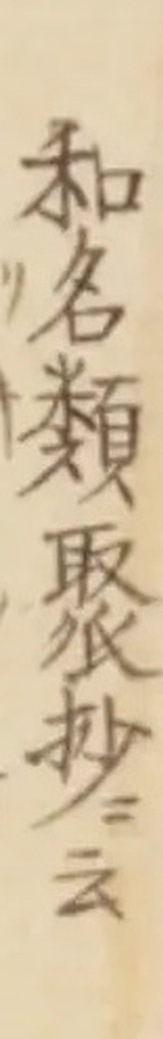和名類聚抄に曰
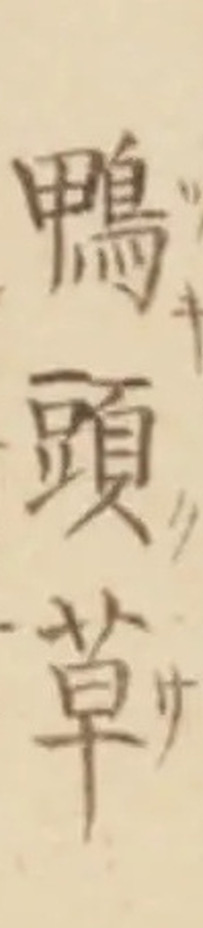鴨頭草
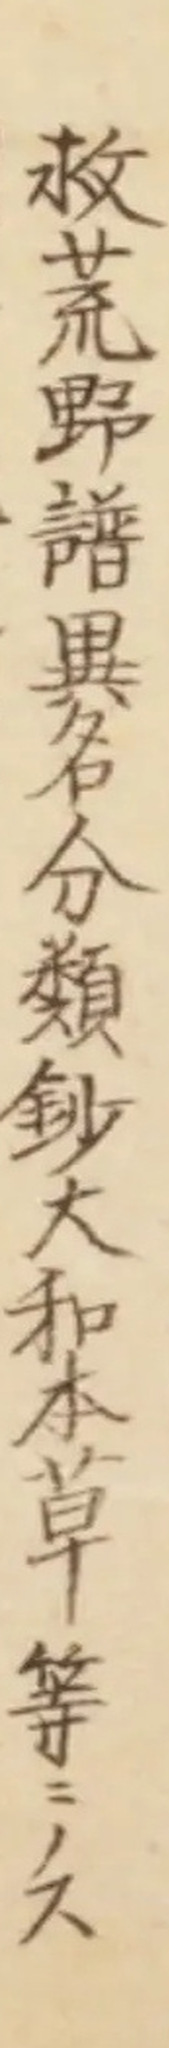救荒野譜異名分類大和本草等にのす
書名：梅園草木花譜夏之部. 1
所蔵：国立国会図書館 National Diet Library, JAPAN
